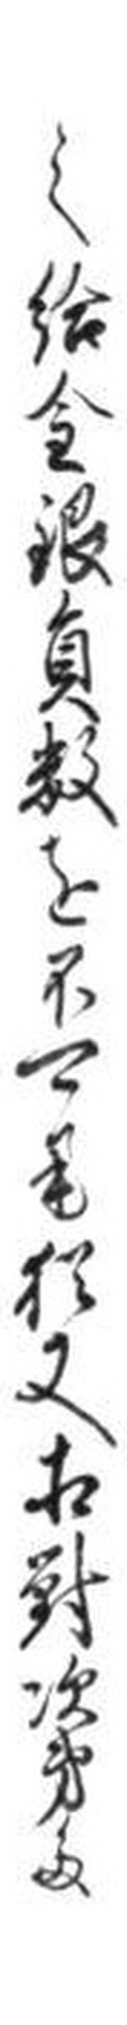之給金銀員数を不可用猶又相対次第た
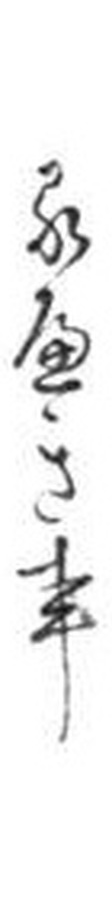るへき事
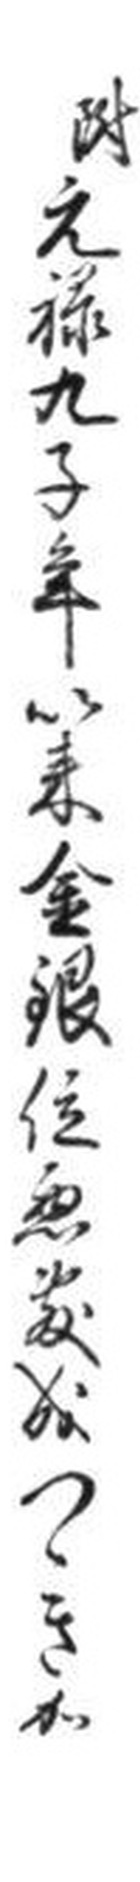付元禄九子年以来金銀位悪敷成つゝきか
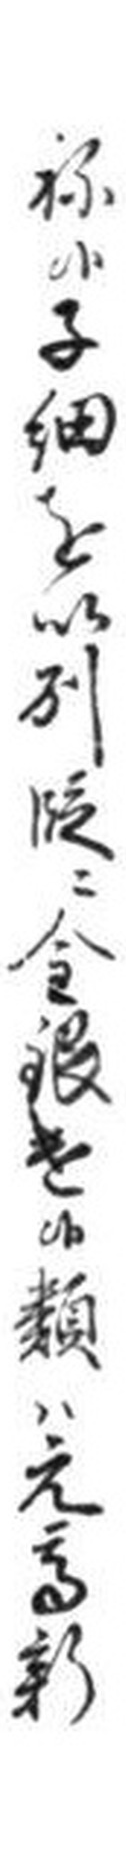ね候子細を以別段ニ金銀遣候類ハ元高新
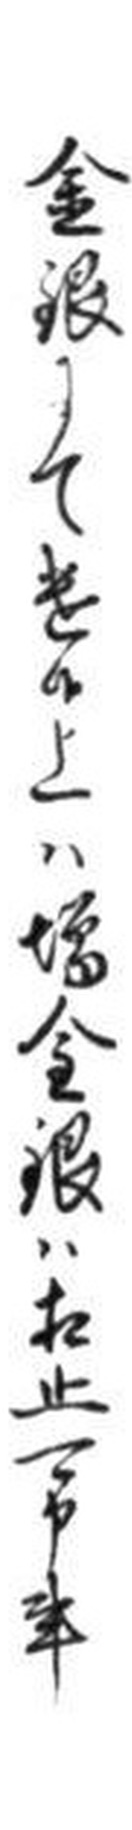金銀にて遣候上ハ増金銀ハ相止可申事
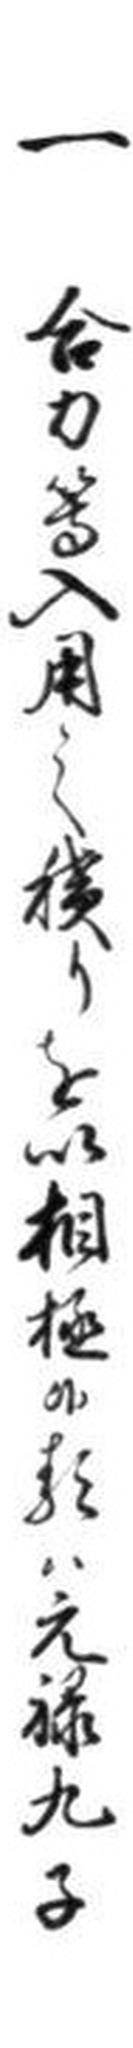一合力等入用之積りを以相極候類ハ元禄九子
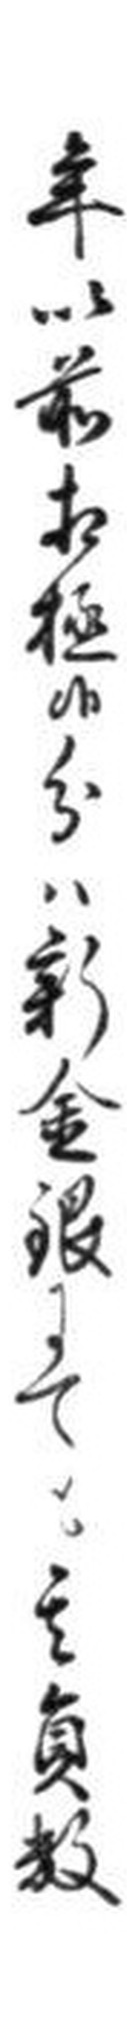年以前相極候分ハ新金銀にても其員数
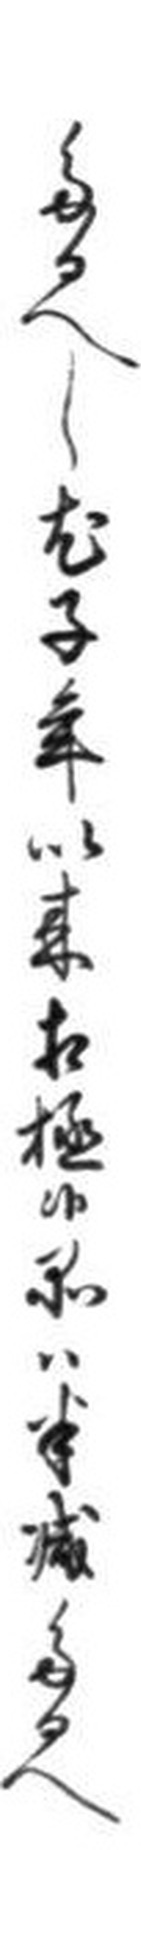たるへし尤子年以来相極候品ハ半減たるへ
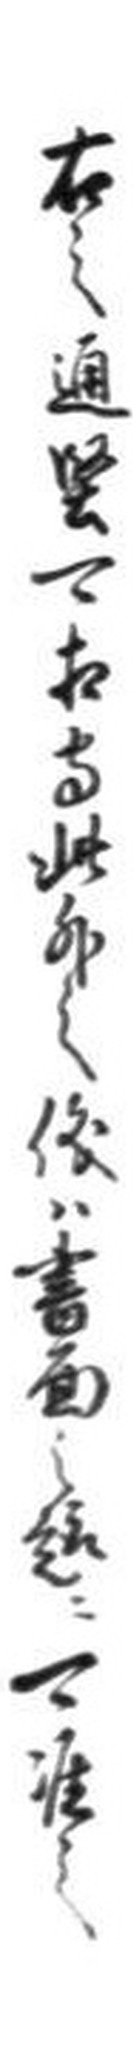右之通堅可相守此外之儀ハ書面之趣ニ可准之
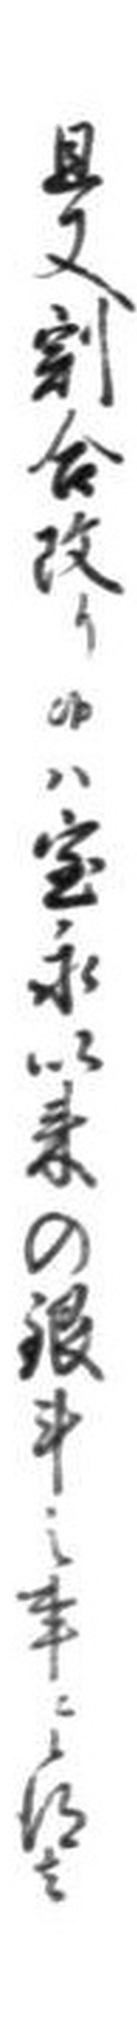且又割合改り候ハ宝永以来の銀斗之事ニ候得者
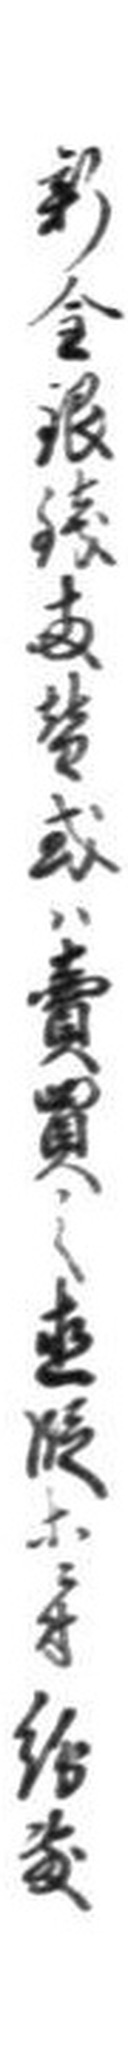新金銀銭両替或ハ売買之直段等ニ付紛敷
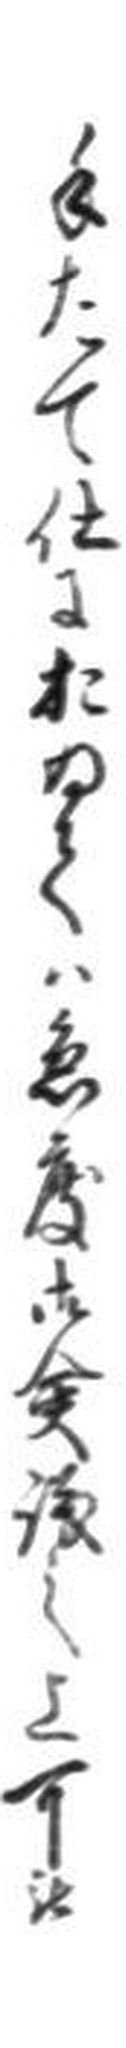手たて仕におゐてハ急度御僉議之上可被
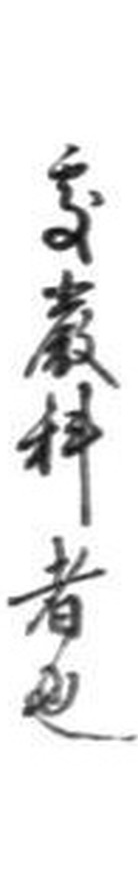処厳科者也
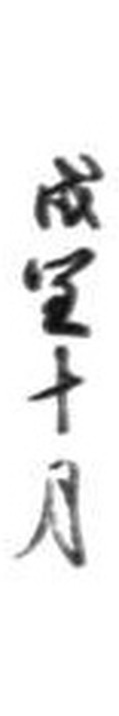戌閏十月
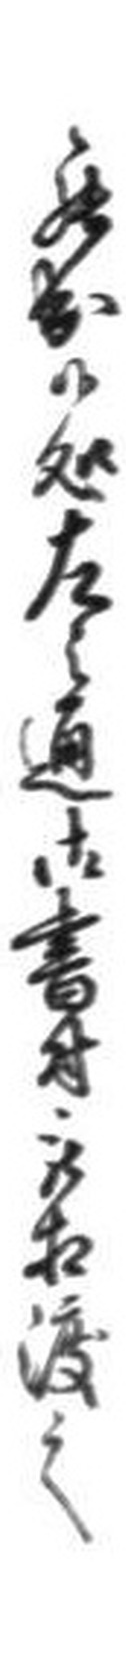罷出候処左之通御書付被相渡之
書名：家譜 三十二 吉邦公 従享保二年到享保三年
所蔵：福井県文書館 Fukui Prefectural Archives
